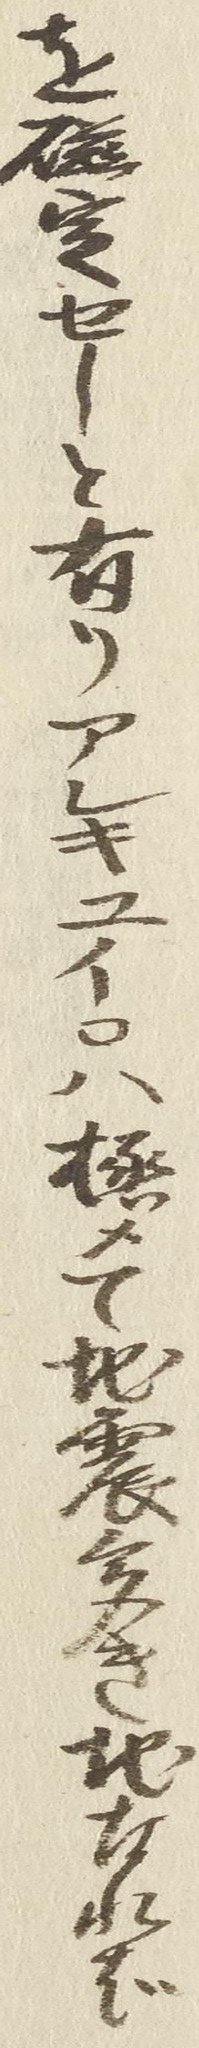を磁定セしと有りアレキユイ○は極メて地震多き地なれば
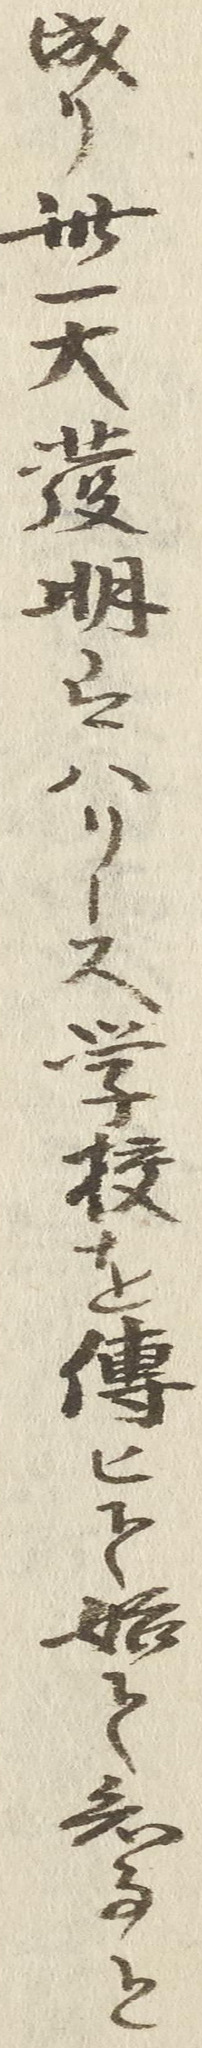成り此一大発明はハリース学校を伝ヒて始て知ると
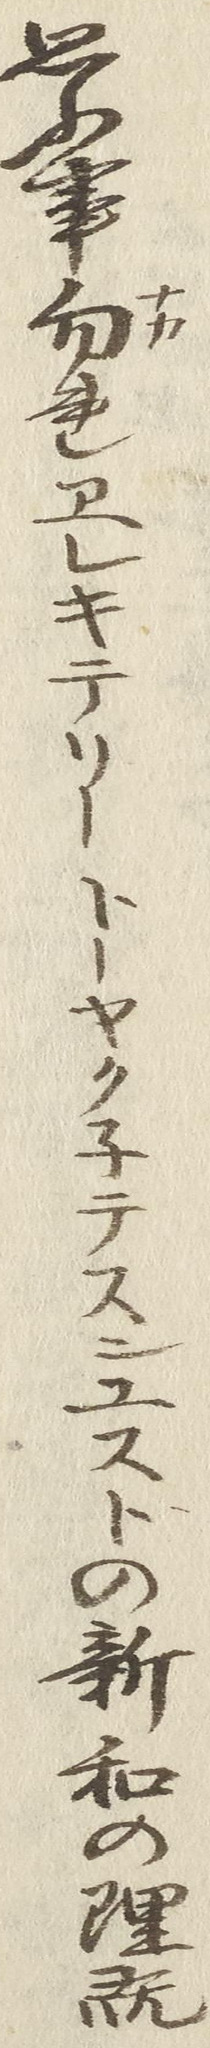思ふ事勿ナカれヱレキテリートーヤク子テスンユストの新和の埋既
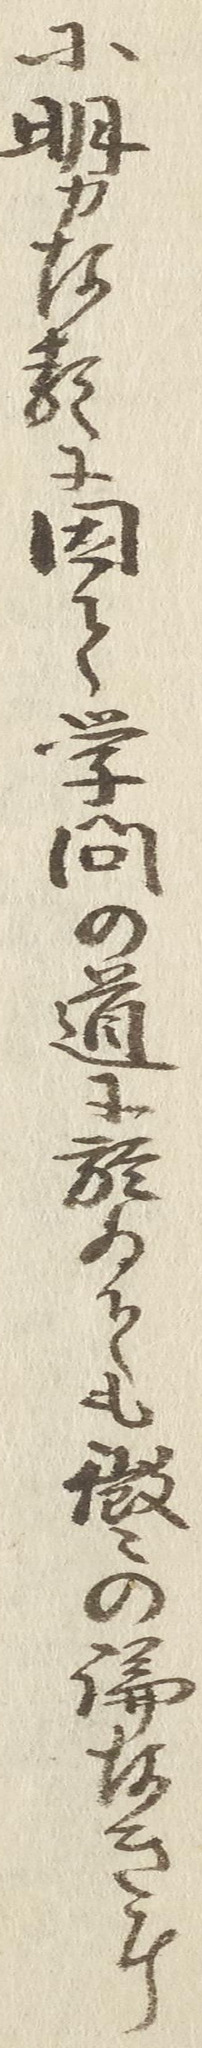に明カなるに因て学問の道に於ゐても徴々の論なきに
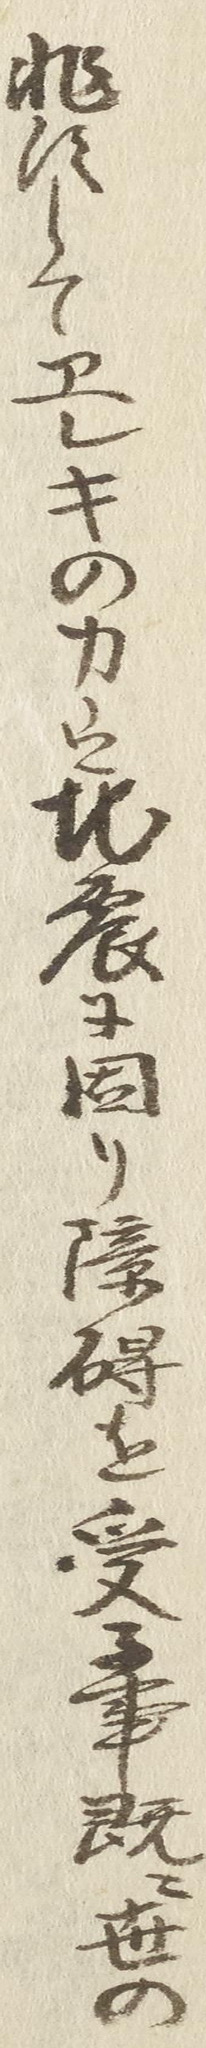非すしてヱレキの力は地震に因り障碍を受る事既ニ世の
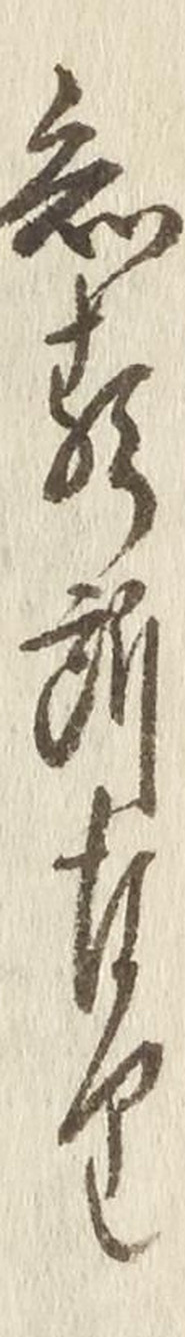知る所なり
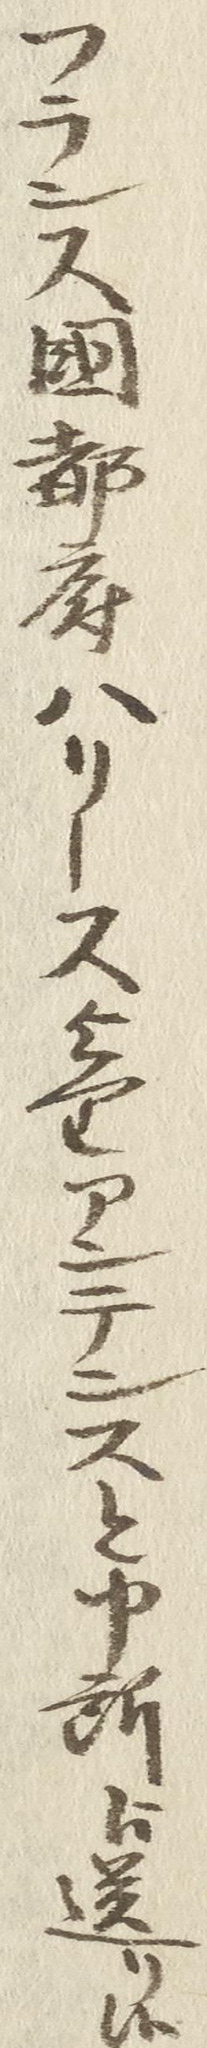フランス国都府ハリースよりアンテンスと申所江送り候
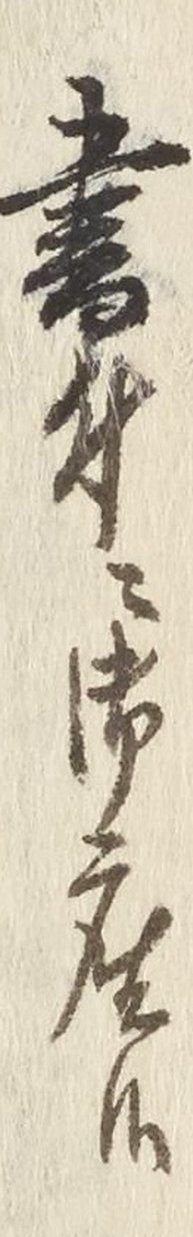書付ニ御座候
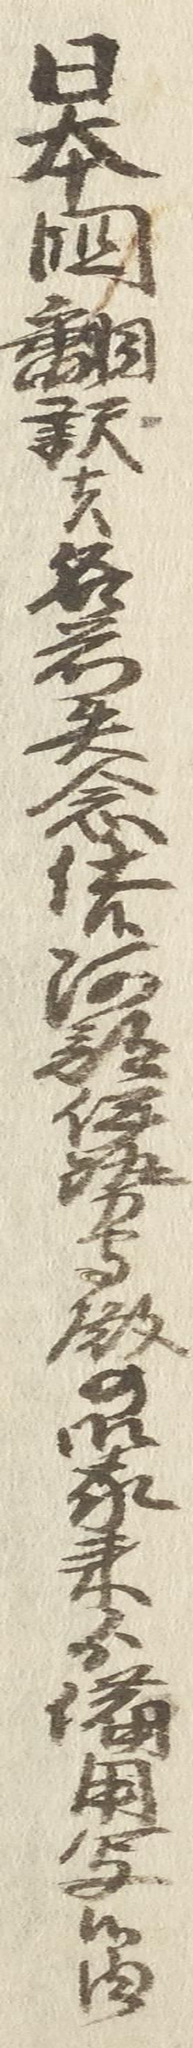日本国翻訳は名前失念仕候阿部伊勢守殿の御家来ゟ備用写候由
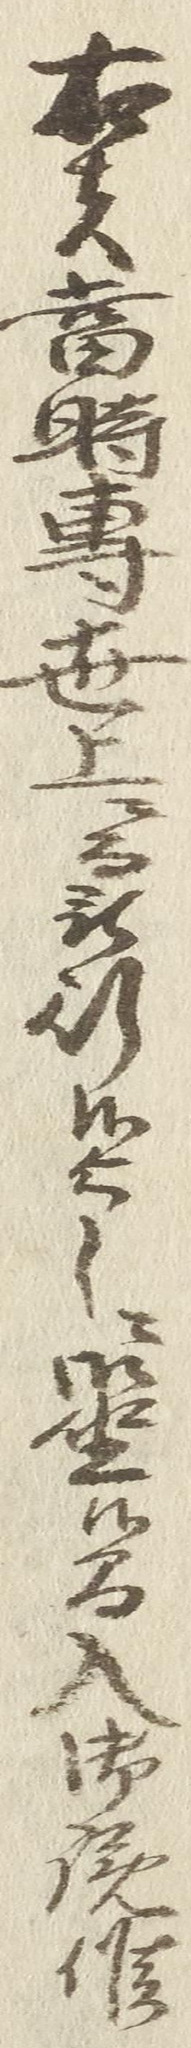右は当時専世上ニ而被行候よしニ御座候間入御覧候

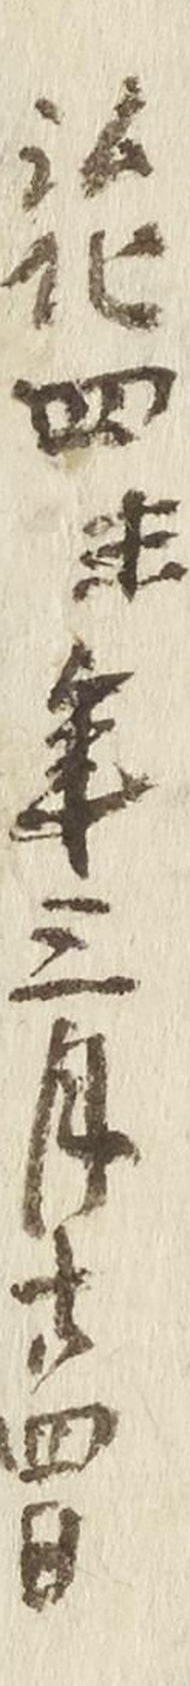弘化四未年三月廿四日
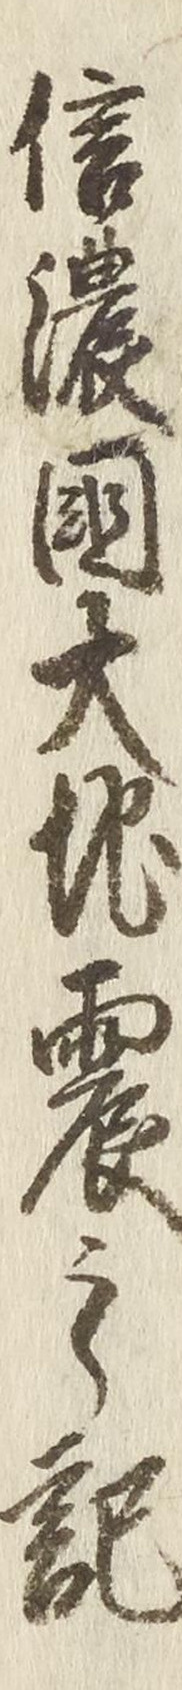信濃国大地震之記
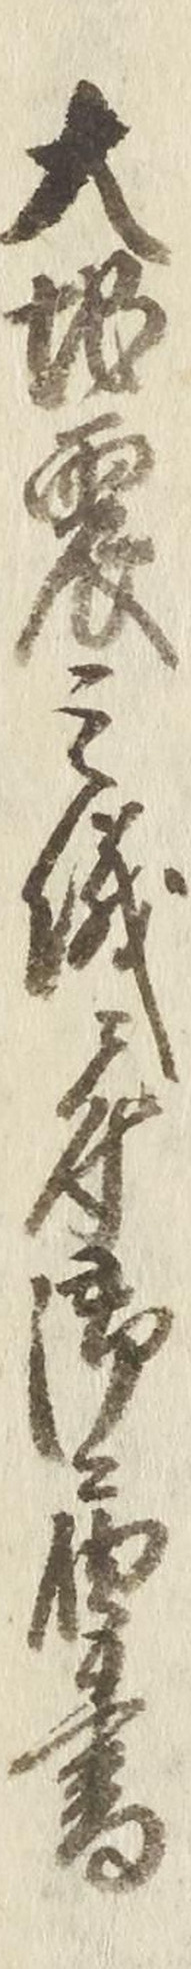大地震之儀ニ付御届書
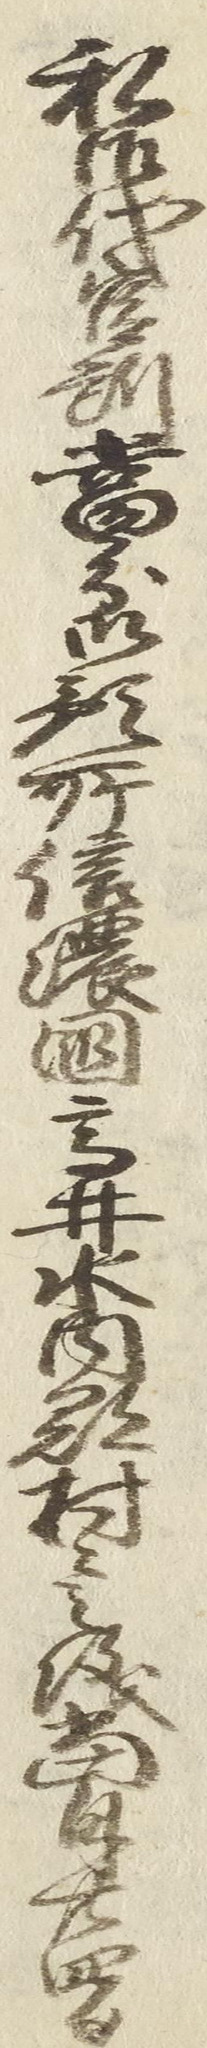私御代官所当分御預所信濃国高井水内郡村々之儀当月廿四日
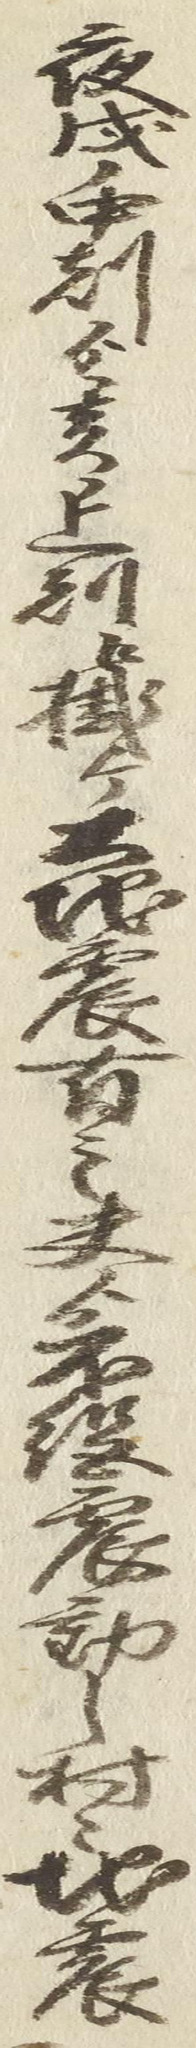夜戌ノ中刻ゟ亥ノ上刻江掛ケ大地震有之夫ゟ不絶震動し村々地震
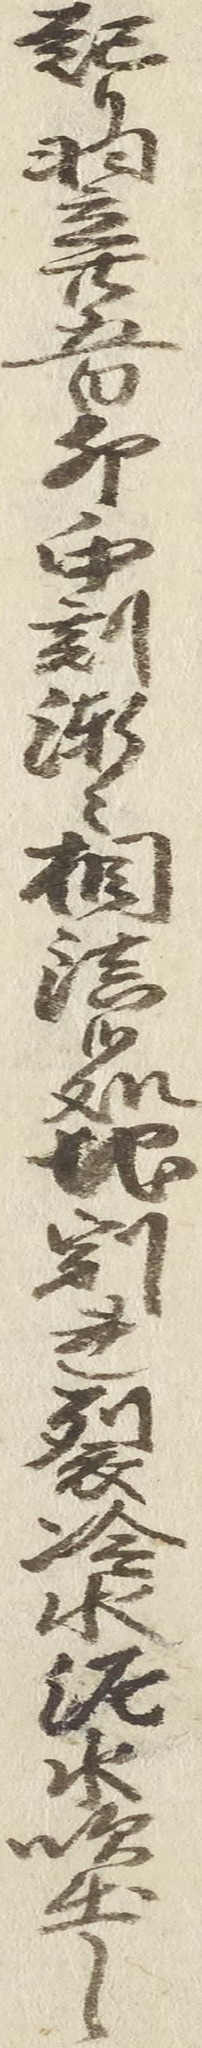起り翌廿五日卯ノ中刻漸々相鎮候処地割れ裂冷水泥水吹出し
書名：従往古地震御届書記誌之一
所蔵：東京大学地震研究所図書室 Earthquake Research Institute Library, The University of Tokyo, JAPAN
